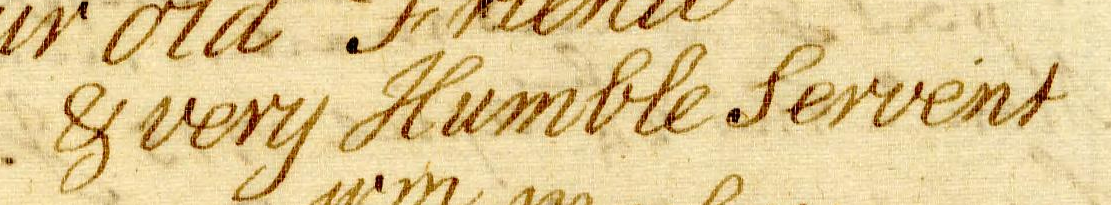& very Humble Servent
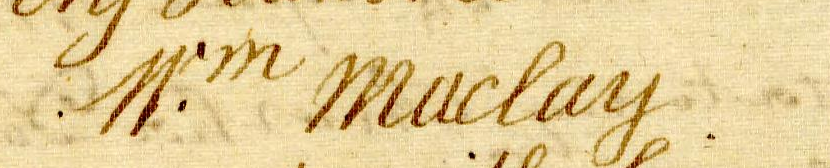W:^m Maclay
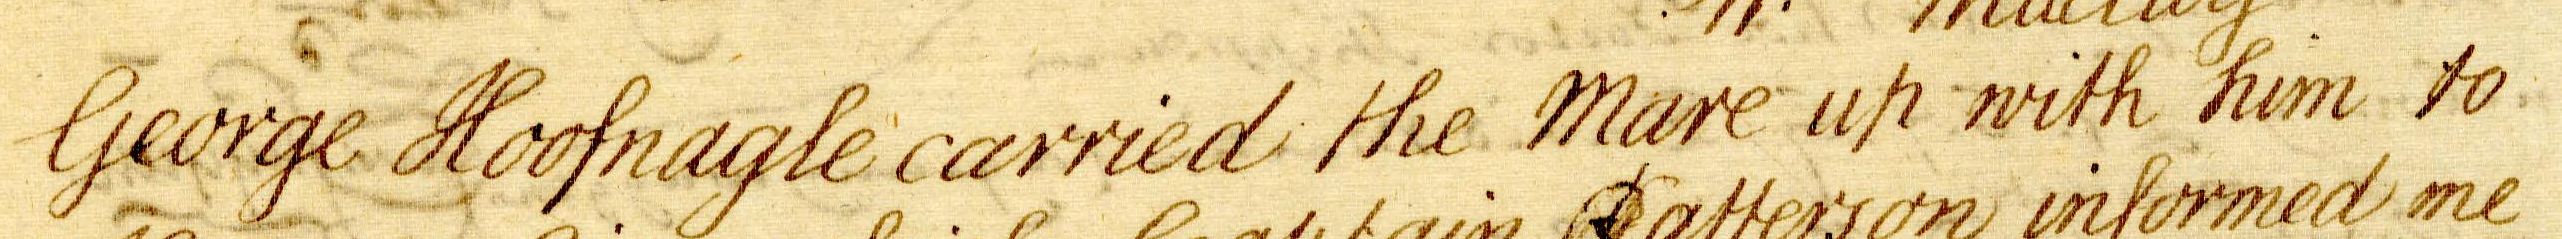George Hoofnagle carried the Mare up with him to
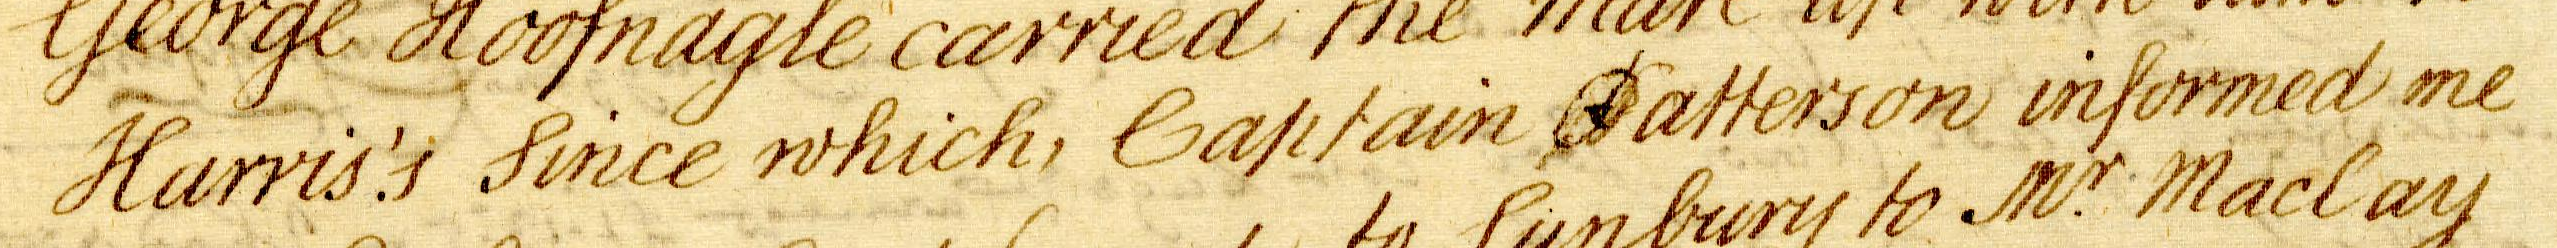Harris's Since which, Captain Patterson informed me
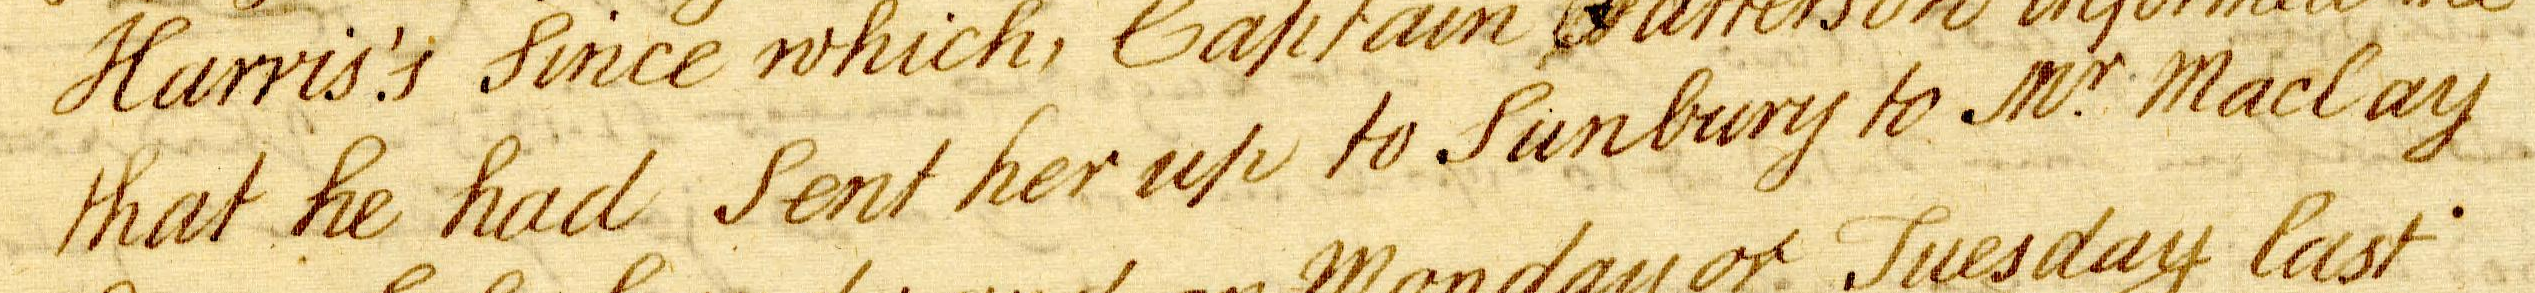that he had Sent her up to Sunbury to M^r. Maclay
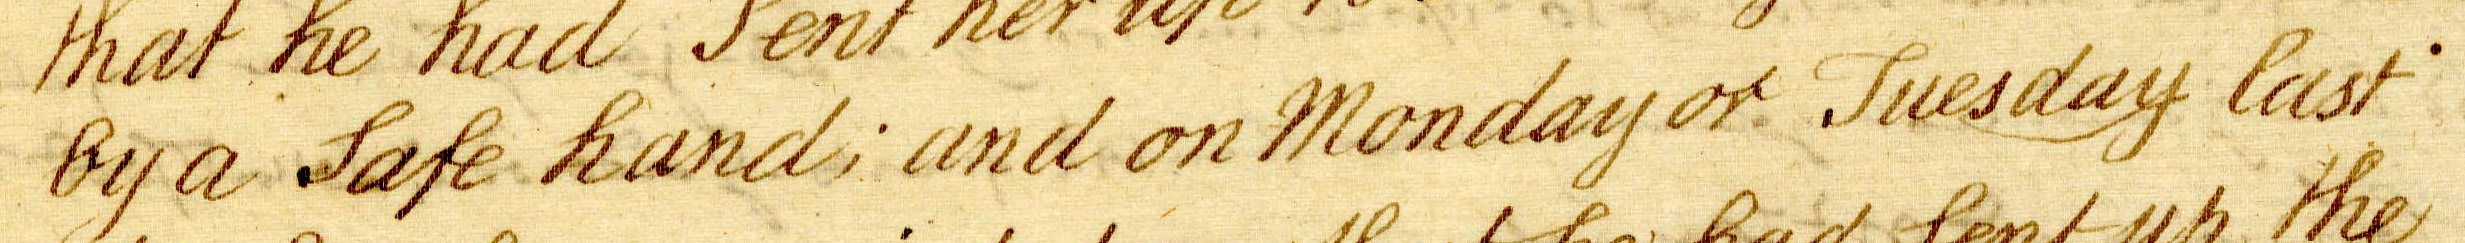by a Safe hand; and on Monday or Tuesday last
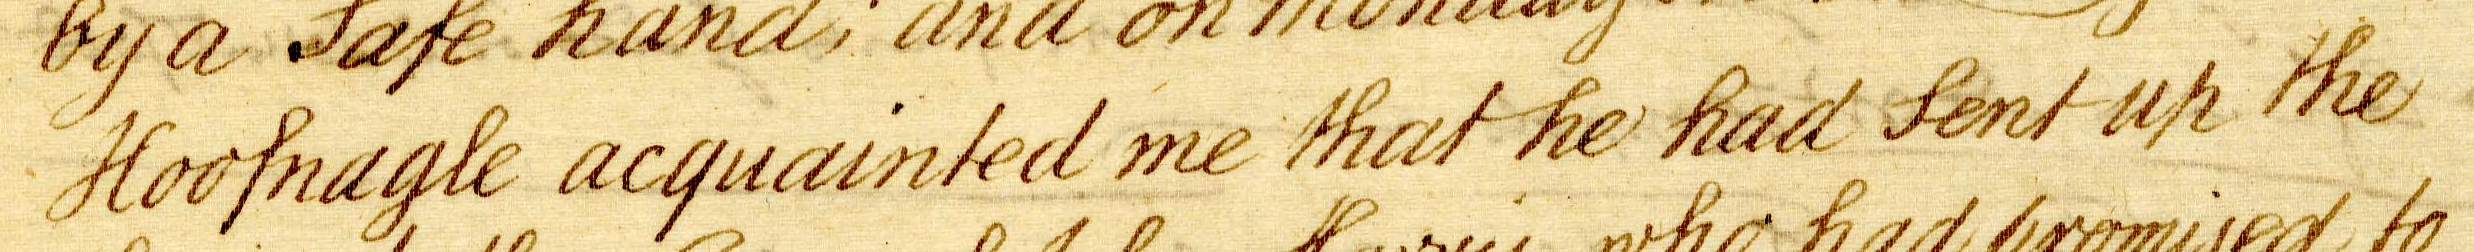Hoofnagle acquainted me that he had Sent up the
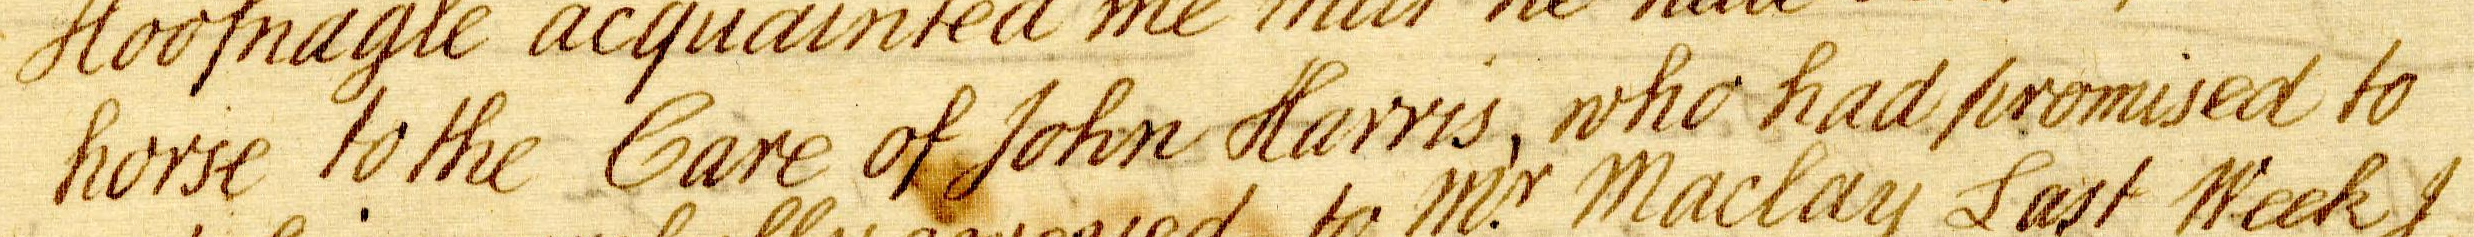horse to the Care of John Harris, who had promised to
